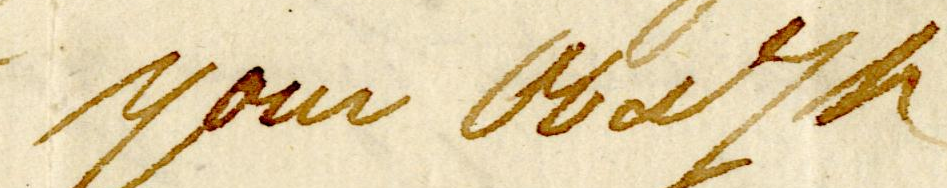your Hb s^t
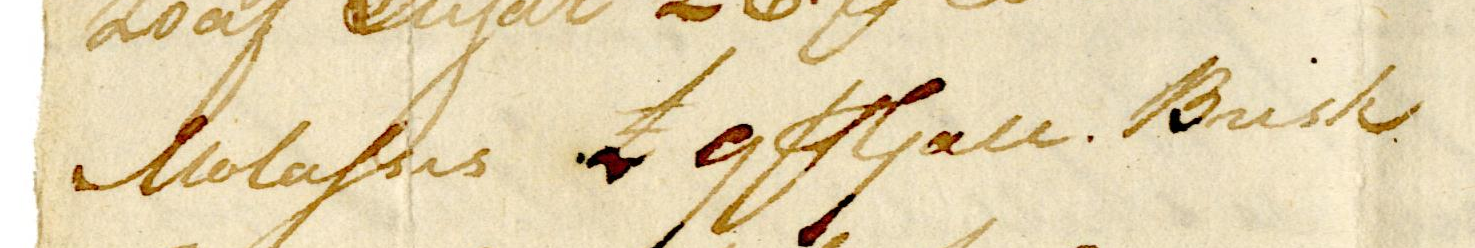Molasses £9 per Gall. Brisk
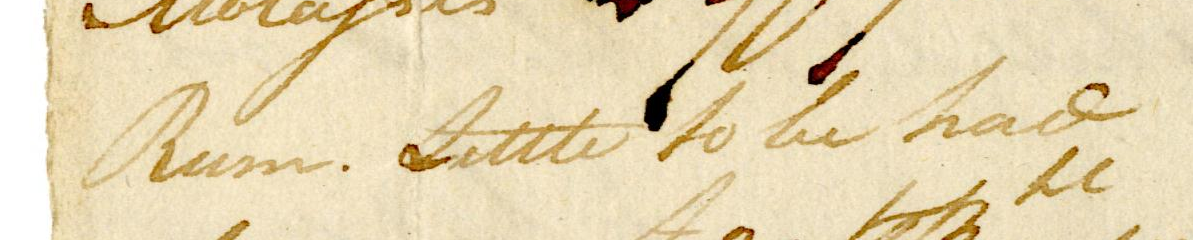Rum. Little to be had
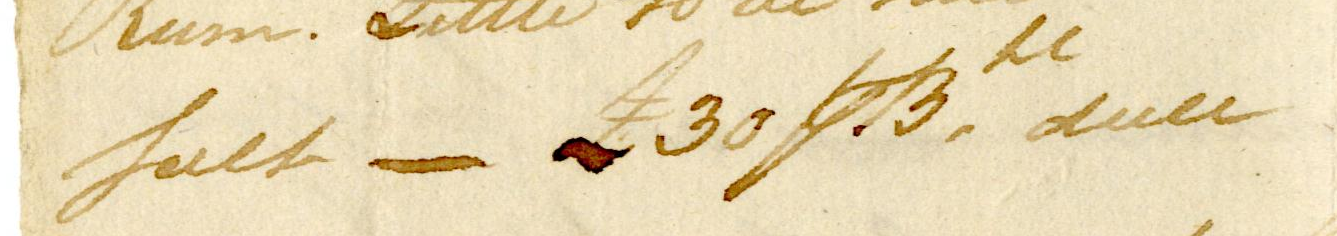Salt- £30 per B^ll. dull
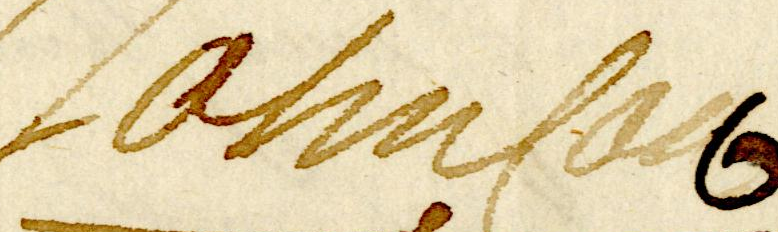John Call
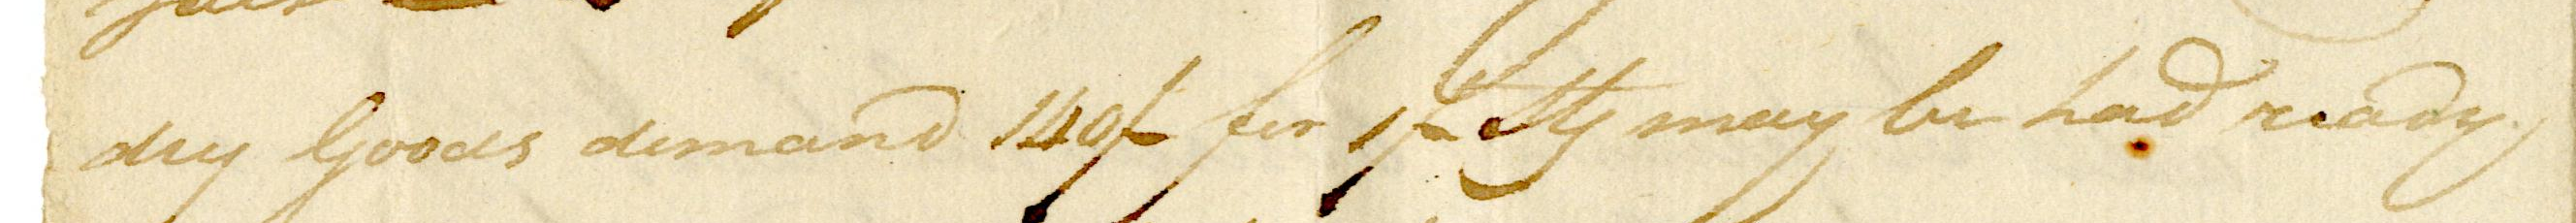dry Goods demand 140 for 12 qty may be had ready
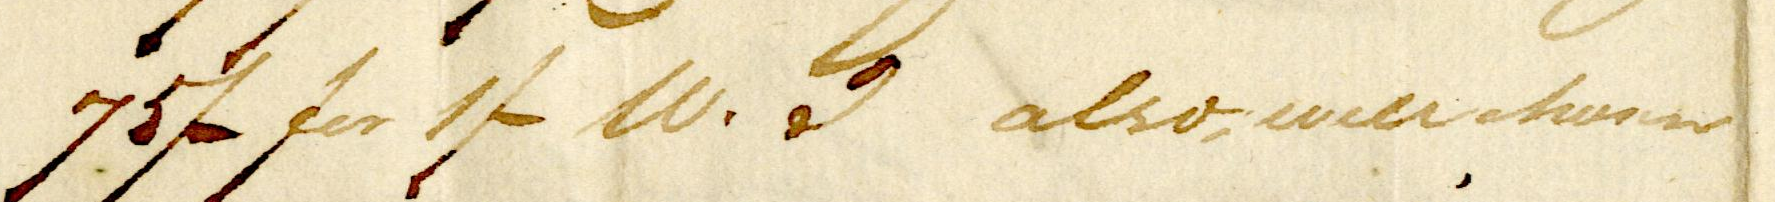75s perr 1s W. I also will choose
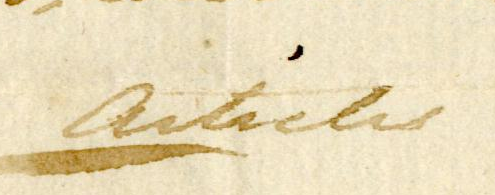articles
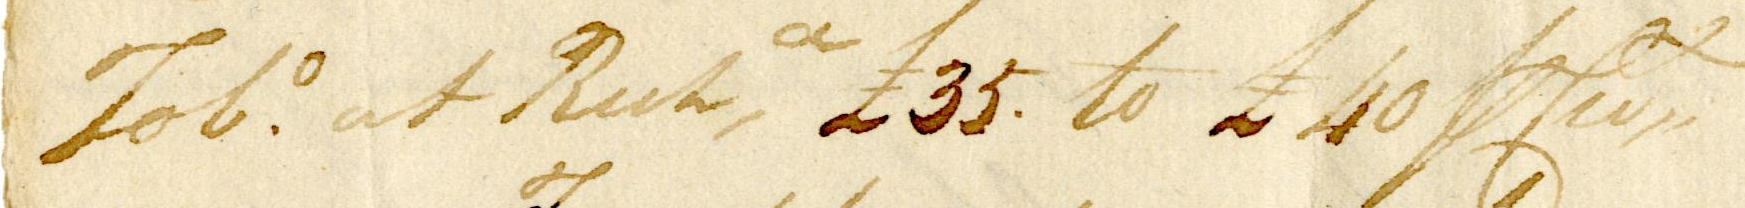Tob^o. at Rich^d, £35. to £40 per hhd
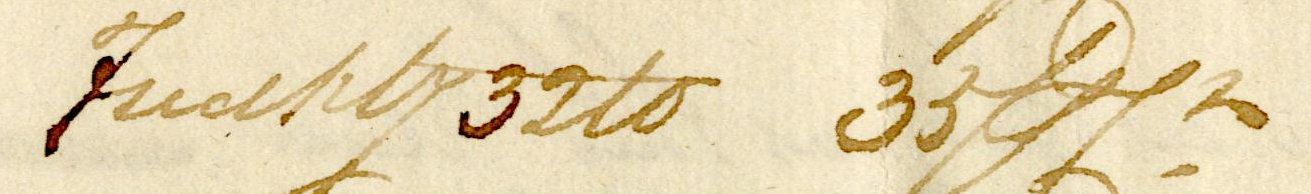Fredb^g 32 to 33 per C^t.
